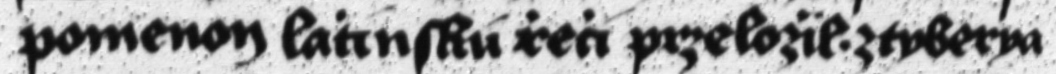pomenon laṫinsku ṙeċí przeložil. ztyberya
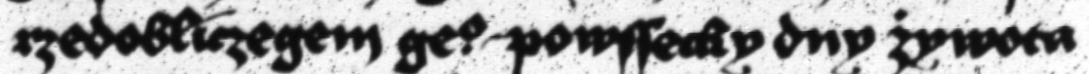rzedoblíczegem ge° powſſecky dny żywota
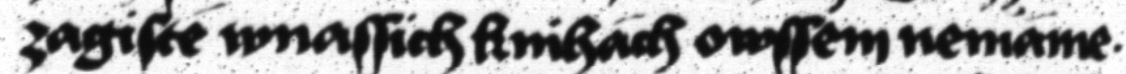zagiſté wnaſſich knihách owſſem nemáme.
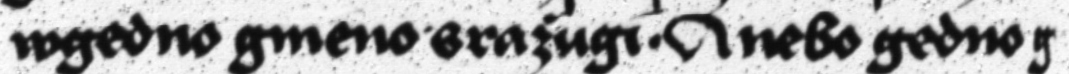wgedno gmeno sražugí. A nebo gedno g
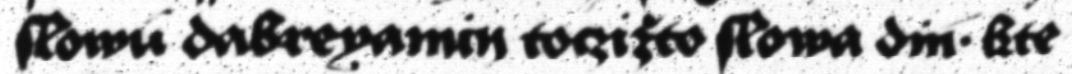ſlowú dabreyamin toczižto ſlowa dṅí. kte
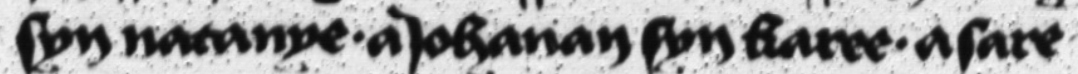ſyn natanye. a Iohanan ſyn karre. a ſare
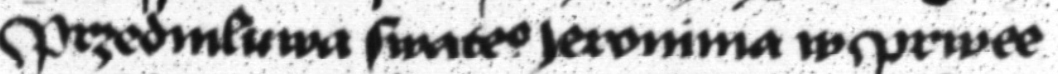Przedmluwa ſwate° Ieronima wPrwee
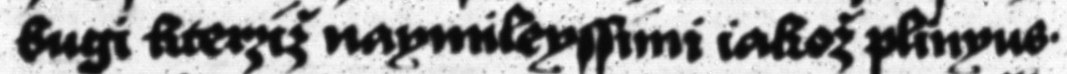bugi kterzíž naymileyſſími iakož plinyus.
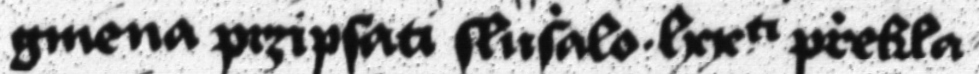gména przipſati ſluẛealo. lxxti pṙekla
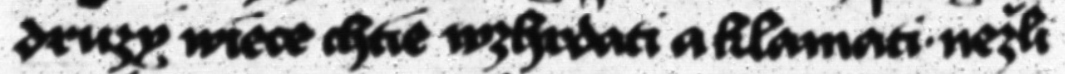druzy wíece chtíe wzhrdati a klamati. nežli
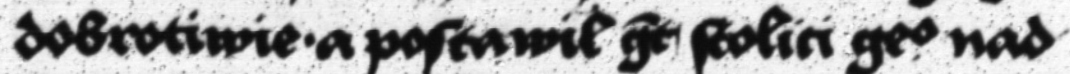dobrotiwie. a poſtawil ḡt ſtolici ge° nad
